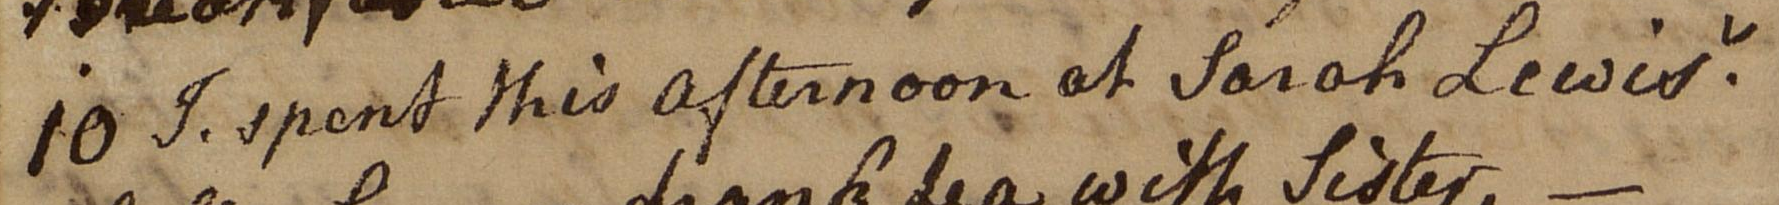10 I spent this afternoon at Sarah Lewis.^s
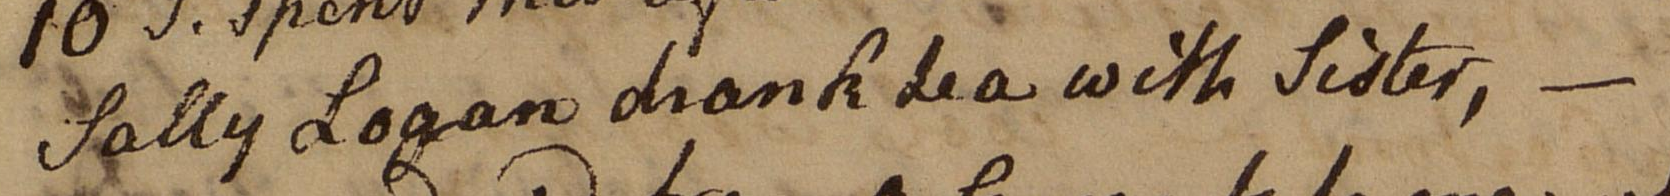Sally Logan drank tea with Sister,-
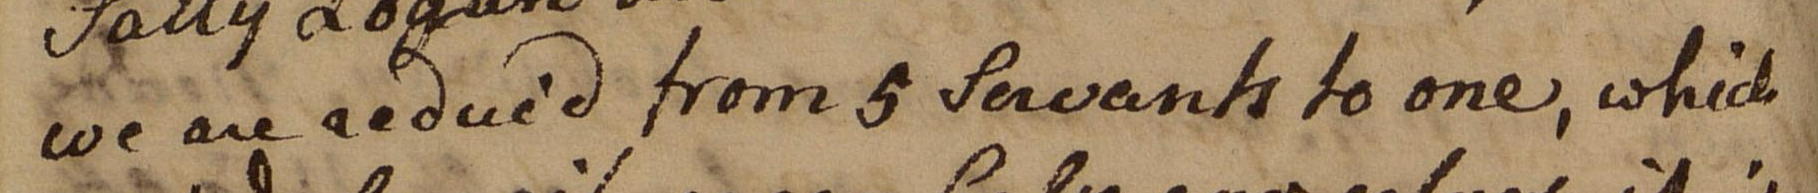we are reduc'd from 5 Servants to one, which
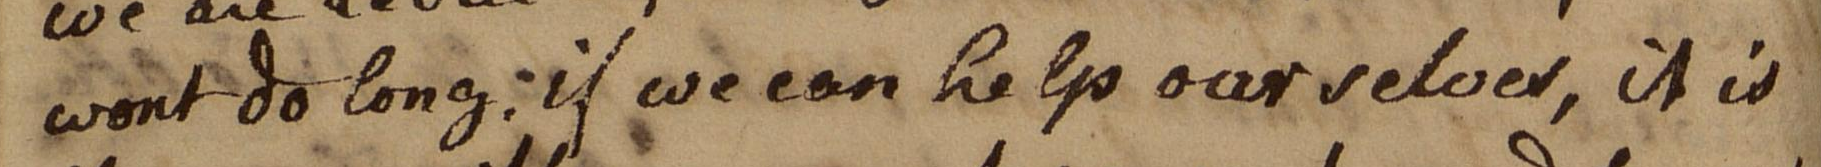wont do long: if we can help ourselves, it is
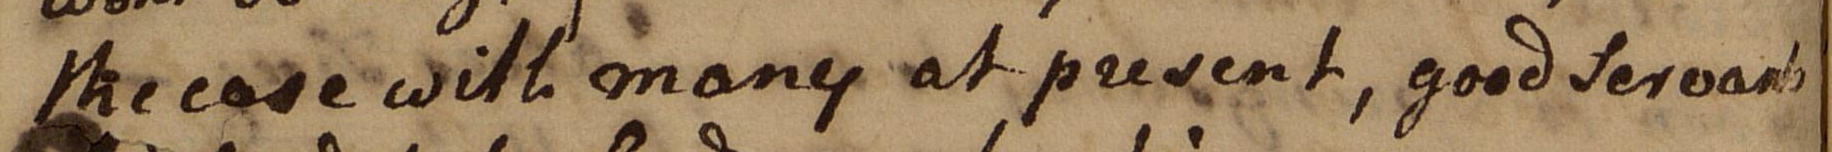the case with many at present, good Servants
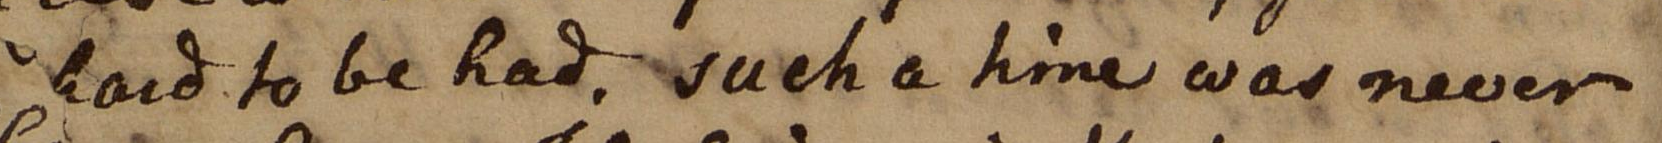hard to be had, such a time was never
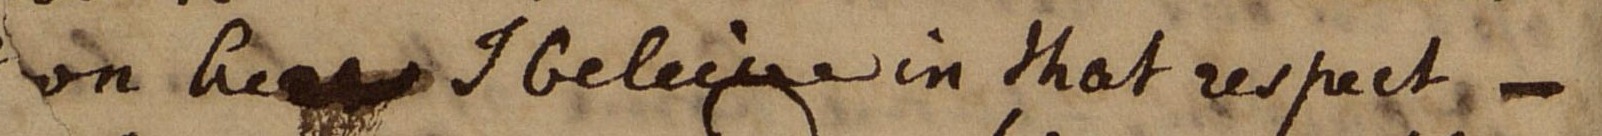on here I beleive in that respect-
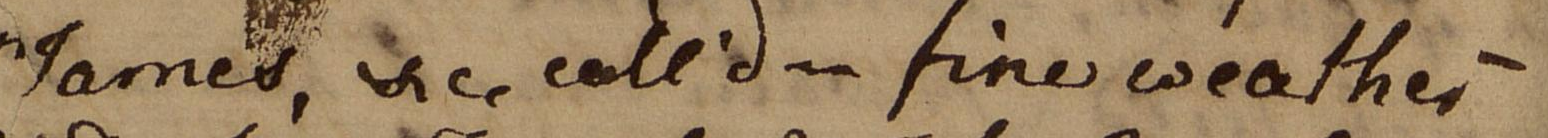James, &c call'd- fine weather-
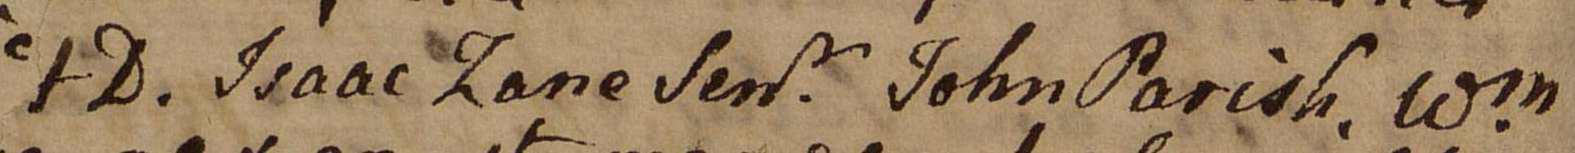D. Isaac Zane Sen^r. John Parish, W.^m
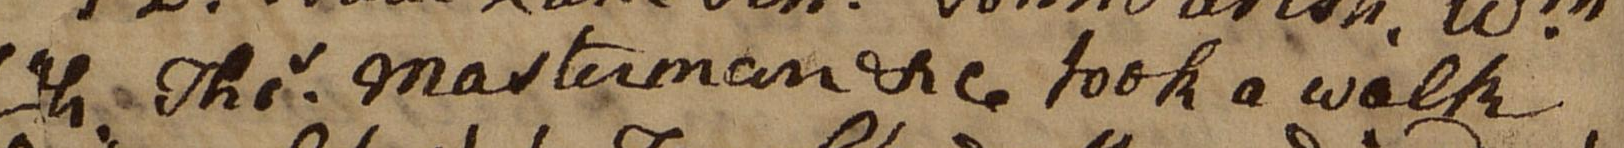h Tho^s. Masterman &c took a walk
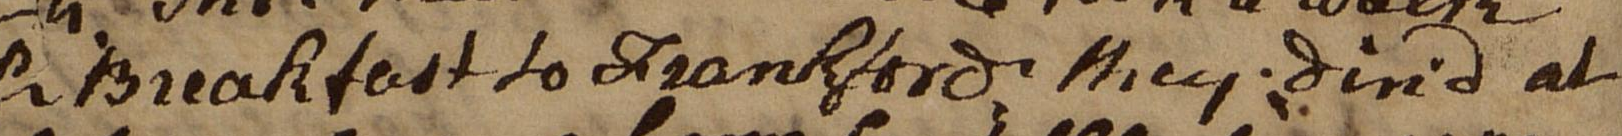Breakfast to Frankford they din'd at
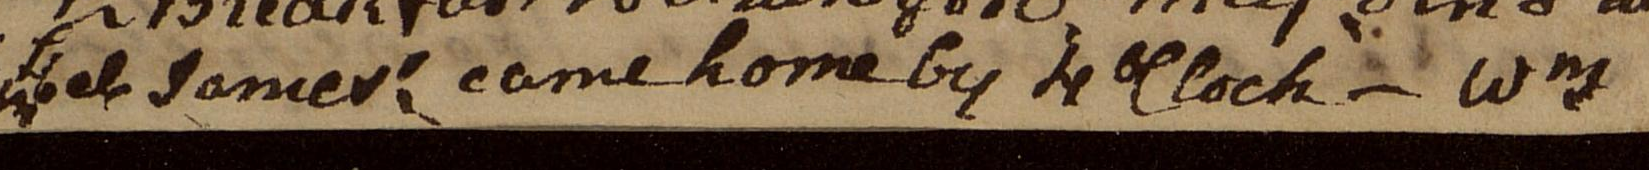bel James; came home by 4 ^oClock- W^m
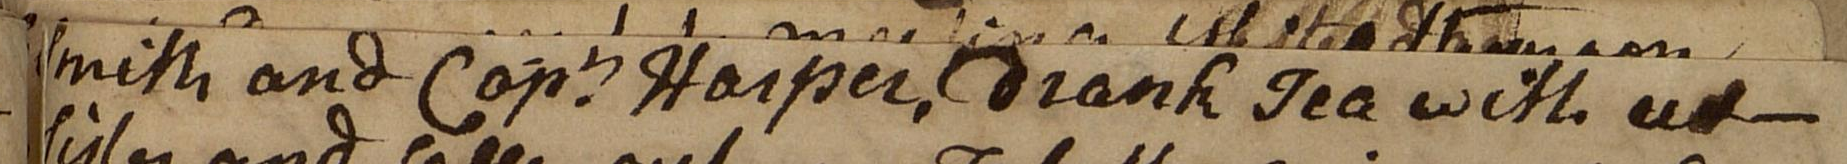Smith and Cap^n. Harper, drank Tea with us-
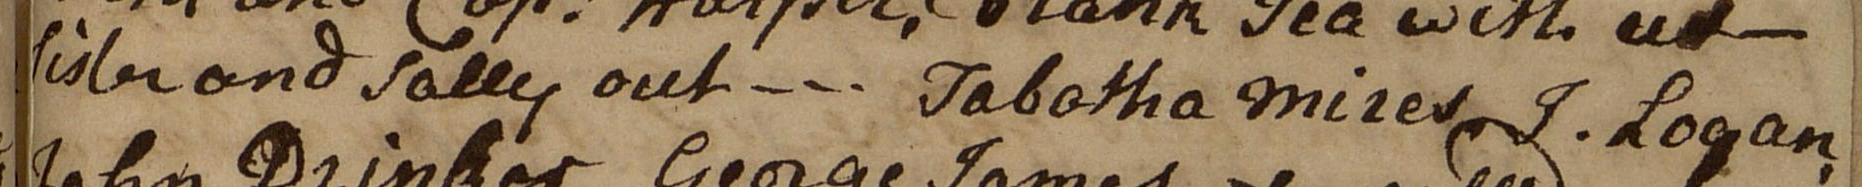Sister and Sally out- Tabatha Mires, J. Logan,
